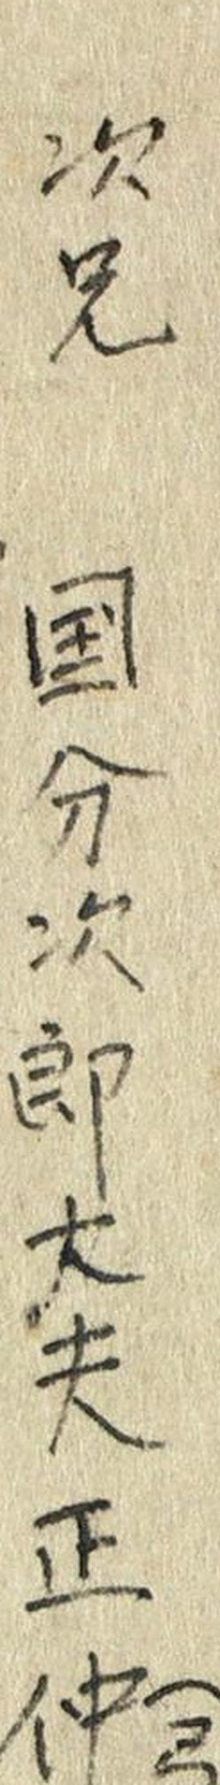次兄国分次郎大夫正仲
